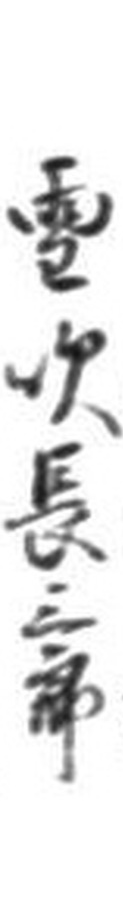雪吹長三郎
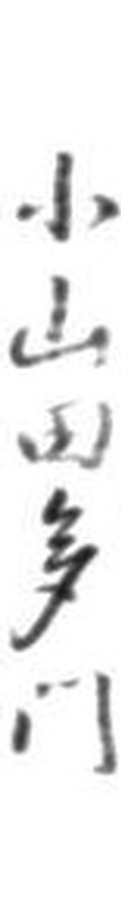小山田多門
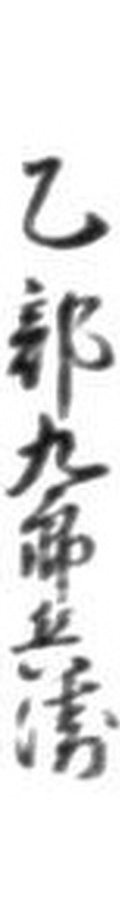乙部九郎兵衛
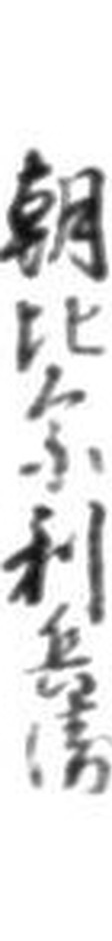朝比奈利兵衛
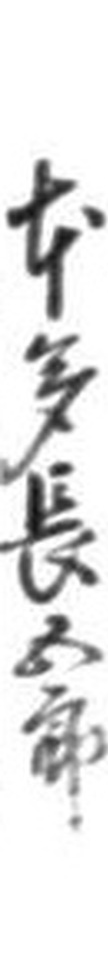本多長五郎
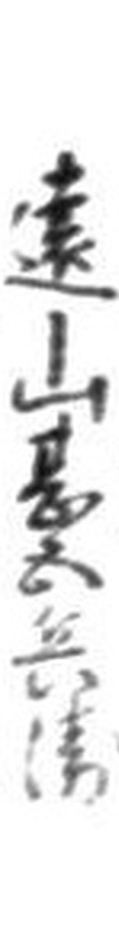遠山甚五兵衛
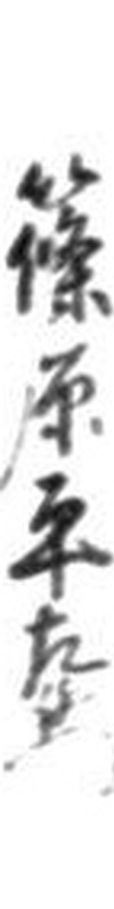篠原平左衛門
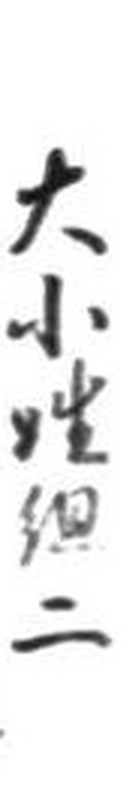大小姓組二
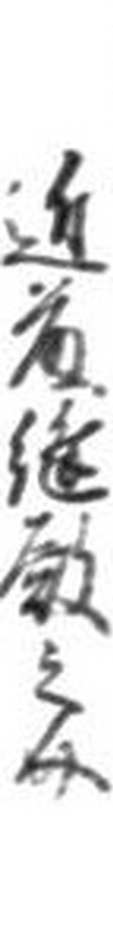近藤縫殿之介
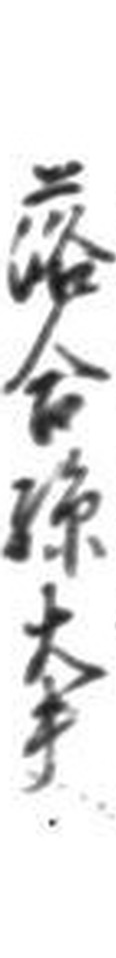落合孫大夫
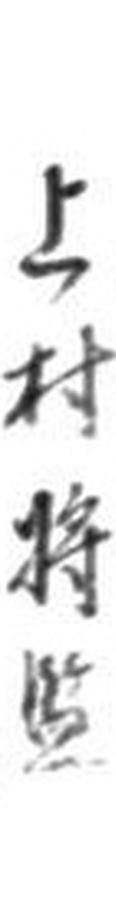上村将監
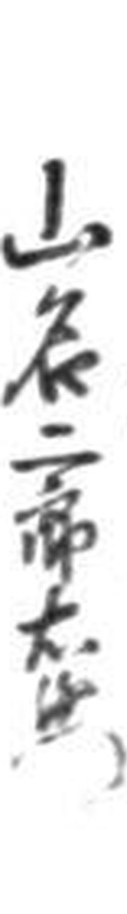山名二郎右衛門
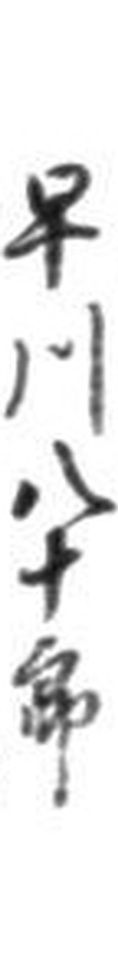早川八十郎
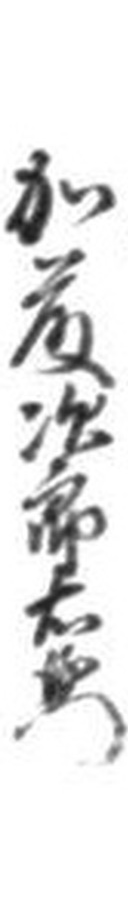加藤次郎右衛門

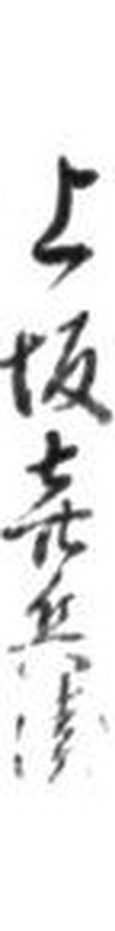上坂喜兵衛
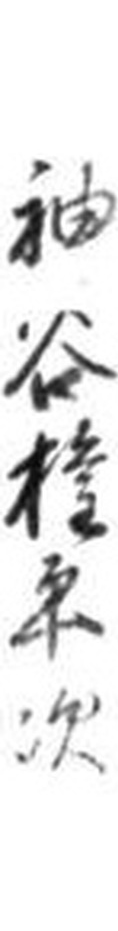袖谷権平次
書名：家譜 二 忠直公 従文禄四年到慶安四年
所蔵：福井県文書館 Fukui Prefectural Archives
